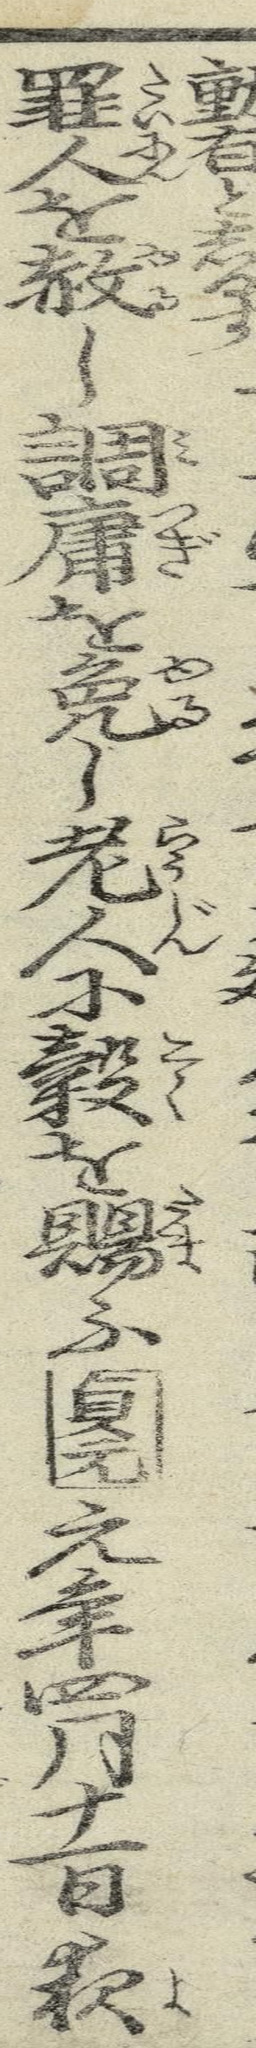罪人を赦し調庸を免し老人に穀を賜ふ貞元元年四月十一日夜
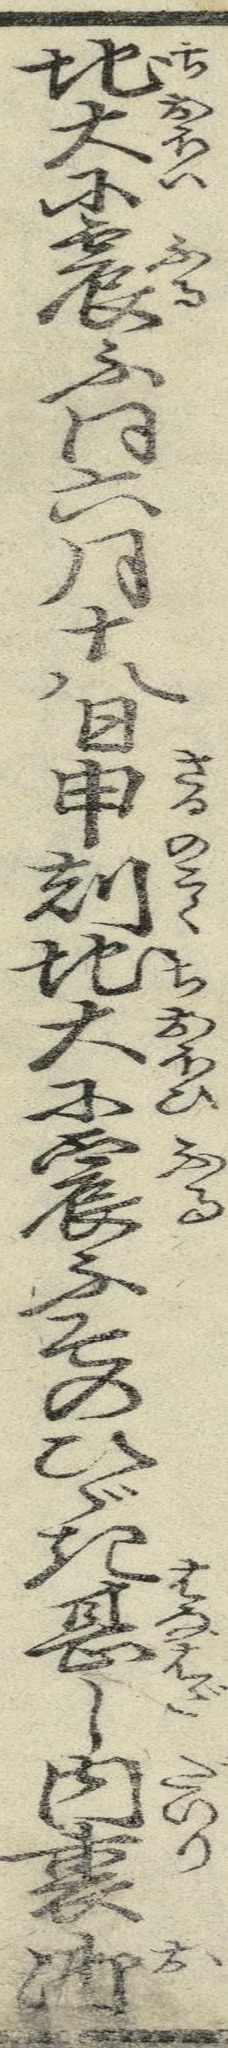地大に震ふ同六月十八日申刻地大に震ふそのひゞき甚し内裏御

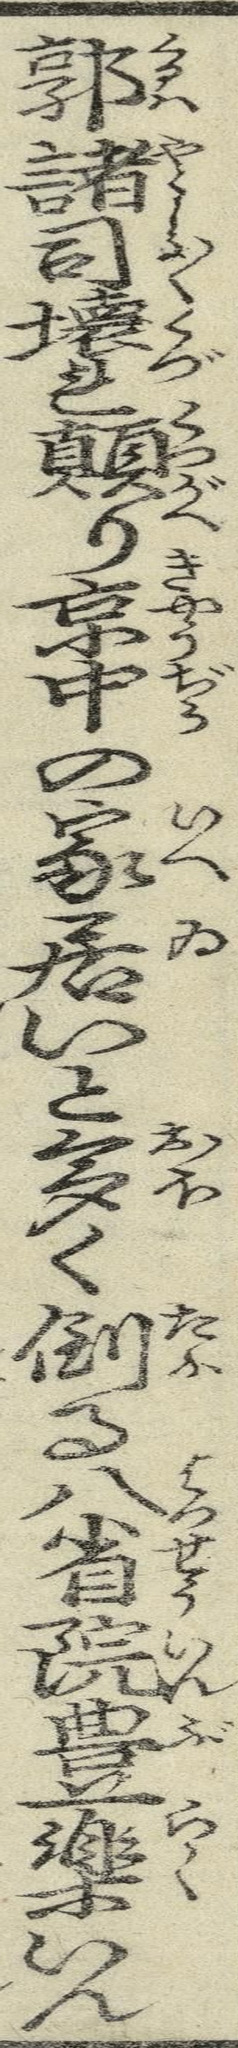郭諸司壊れ顛り京中の家居いと多く倒る八省院豊楽いん
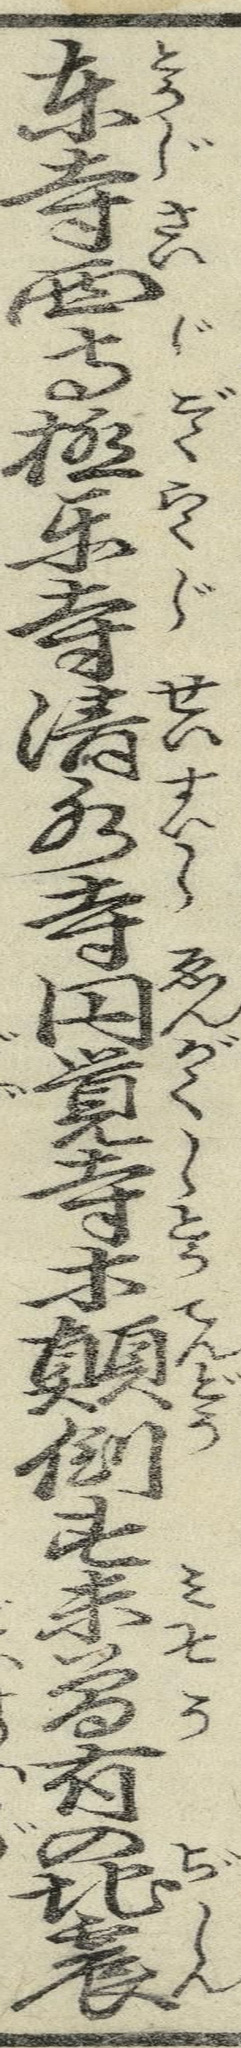東寺西寺極楽寺清水寺円覚寺等顛倒す未曽有の地震
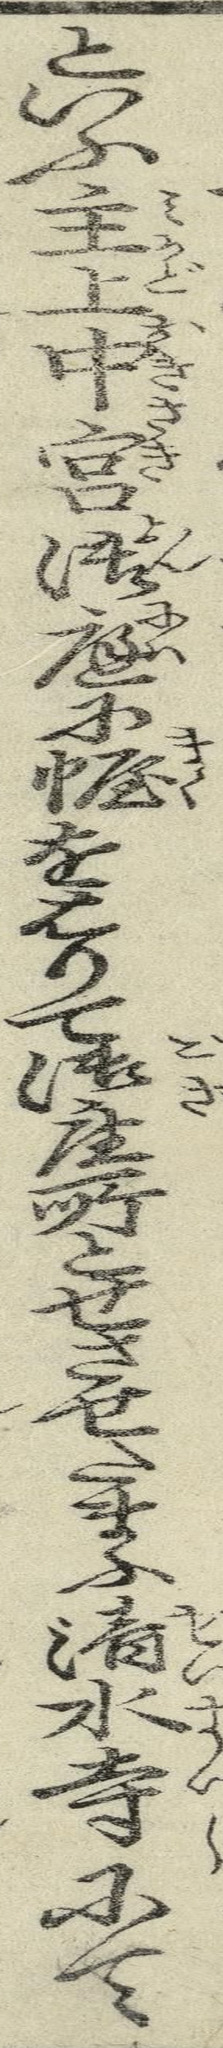といふ主上中宮御庭に幄をはりて御座所とせさせたまふ清水寺にて
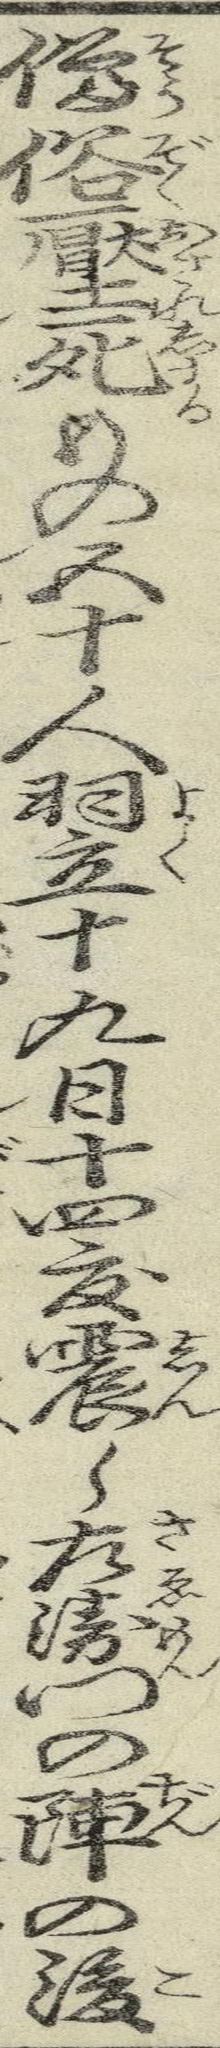僧俗圧死もの五十人翌十九日十四度震し左衛門の陣の後
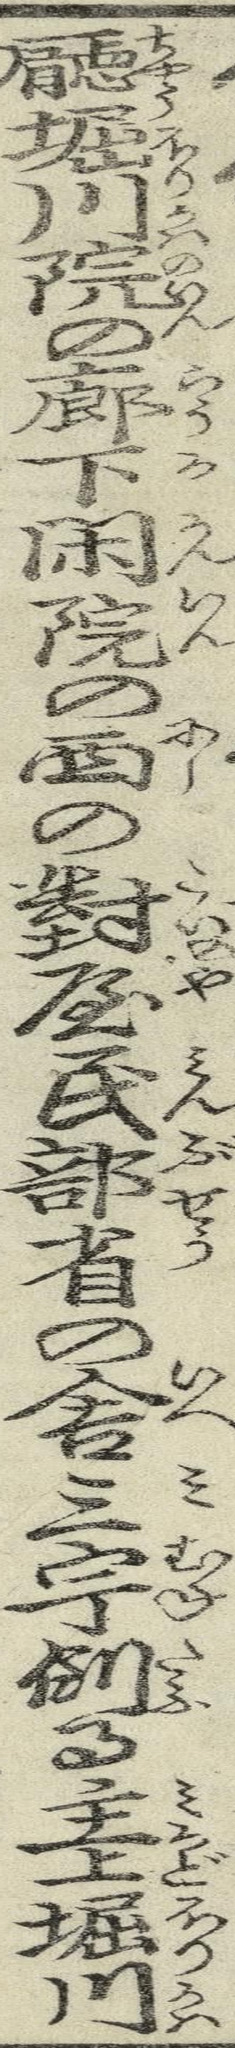庁堀川院廊下閑院の西の対屋民部省の舎三宇倒る主上堀川
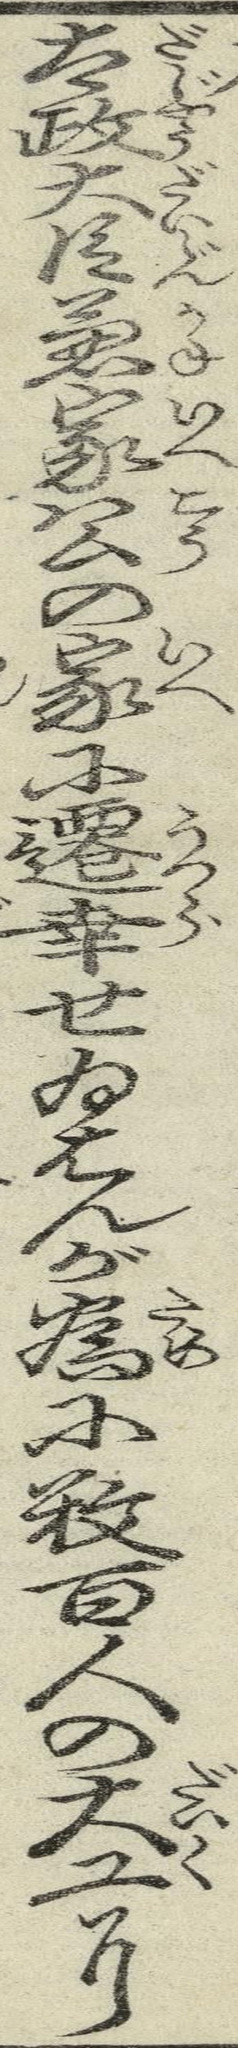太政大臣兼家公の家に遷幸せ給はんが為に数百人の大工に
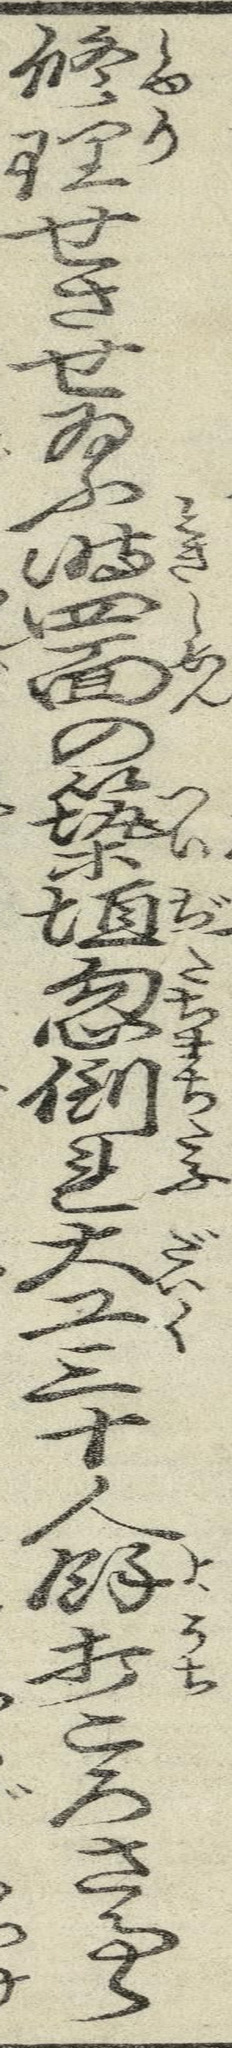修理せさせ給ふ時四面の築垣忽倒れ大工三十人余打ころさるゝ
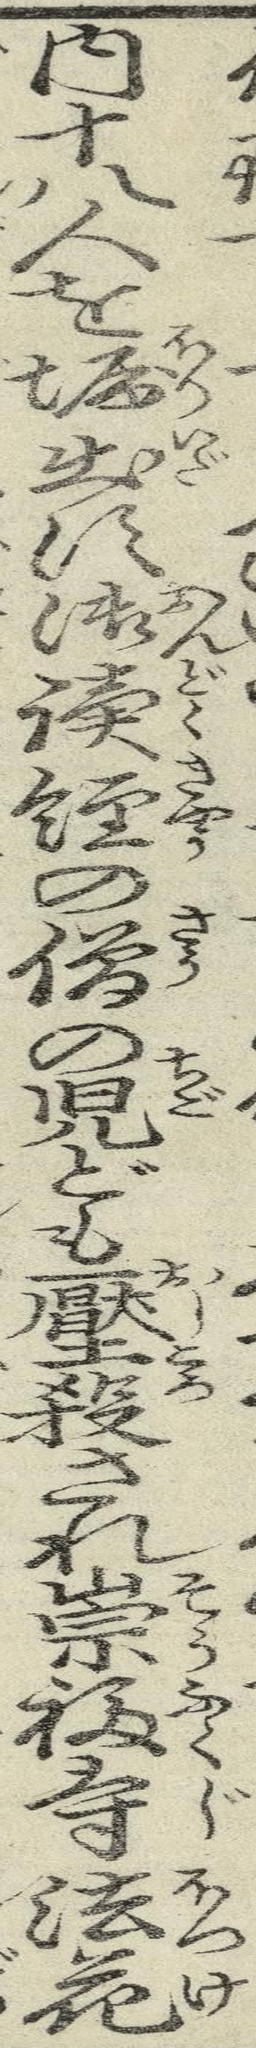内十八人を堀出す御読経の僧の児ども圧殺され崇福寺法花
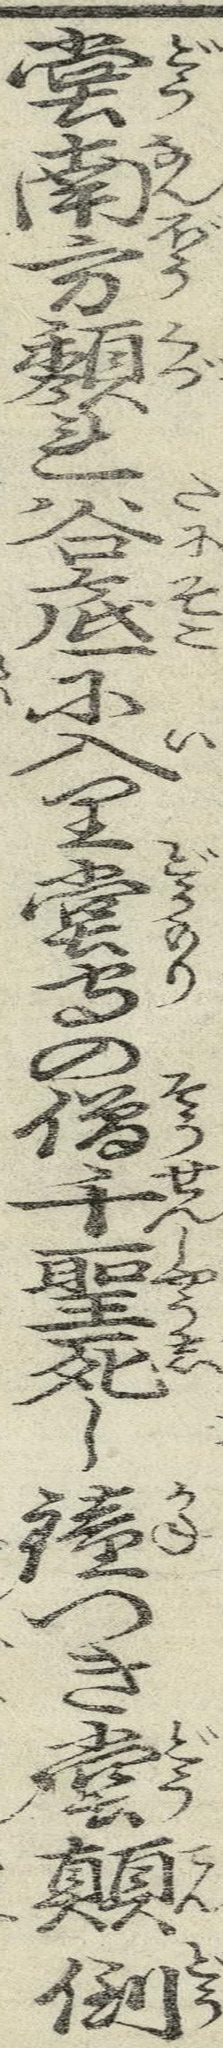堂南方頽れ谷底に入り堂守の僧千聖死し鐘つき堂顛倒
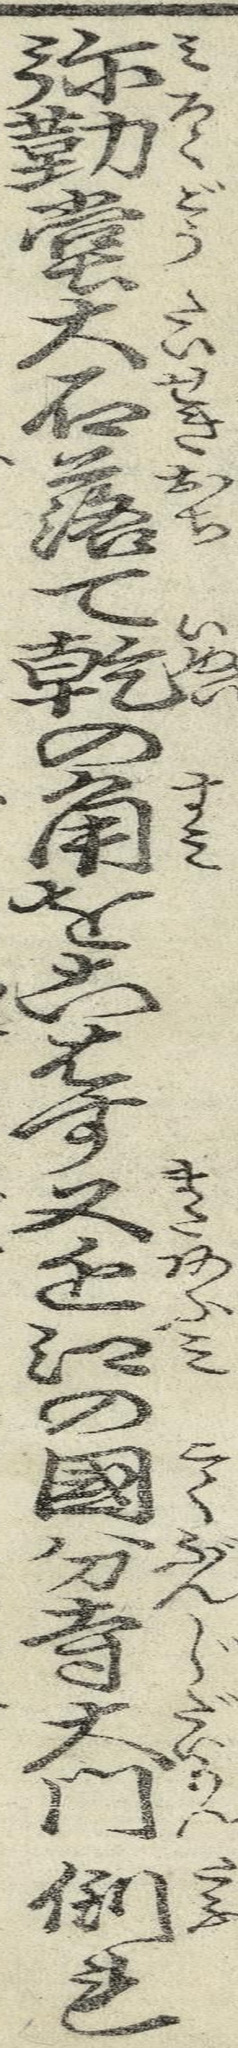弥勒堂大石落て乾の角をこはす又近江の国分寺大門倒れ
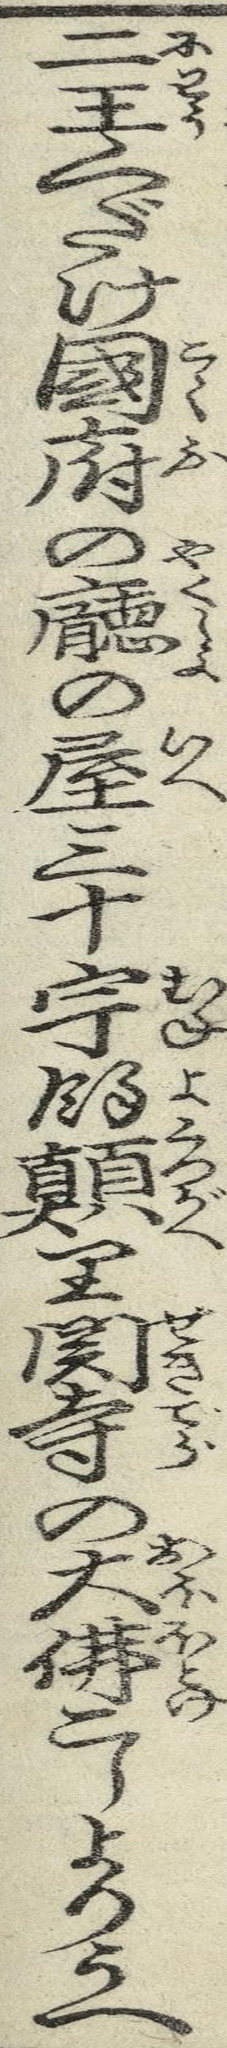二王くだけ国府の庁の屋三十宇余顛り関寺の大佛こしよりうへ
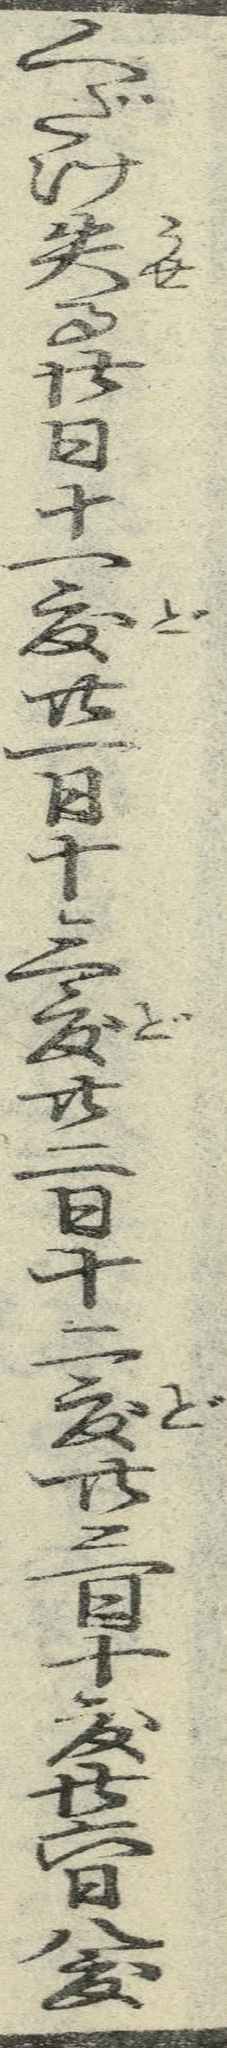くだけ失る廿日十一度廿一日十三度廿二日十二度廿三日十度廿六日八度
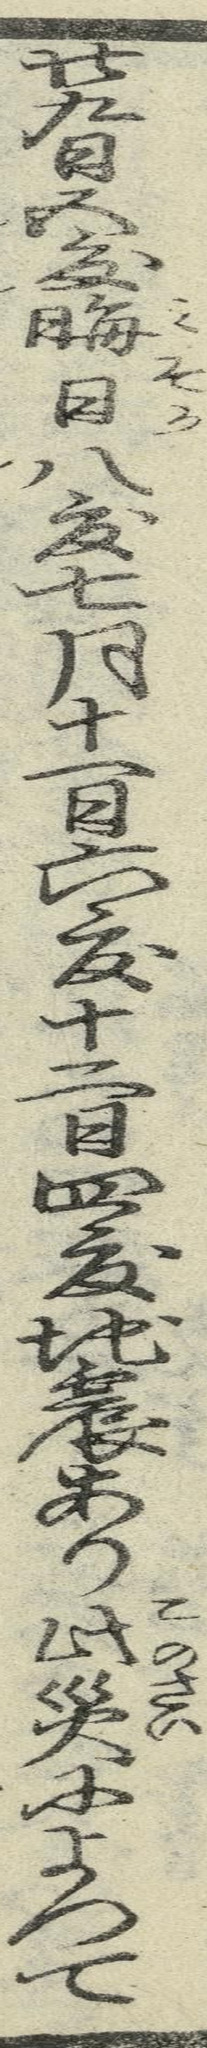廿九日五度晦日八度七月十一日六度十二日四度地震あり此災によつて
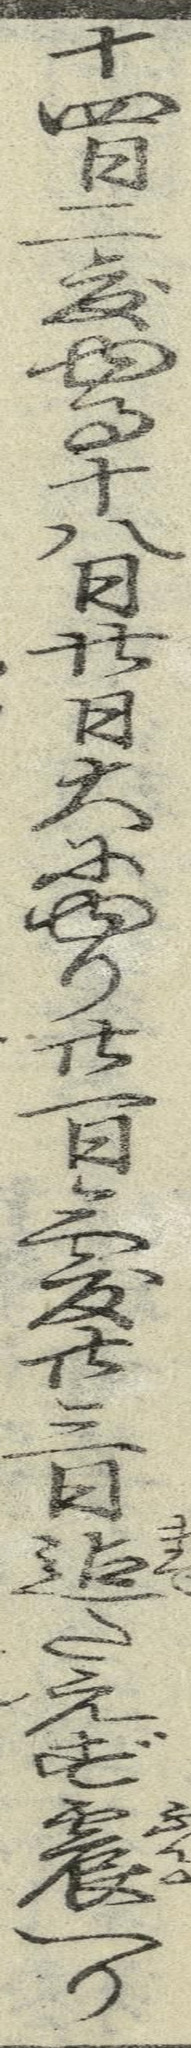十四日二度ゆる十八日廿日大にゆり廿一日三度廿三日迄たえず震へり
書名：地震年代記
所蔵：東京大学地震研究所図書室 Earthquake Research Institute Library, The University of Tokyo, JAPAN
